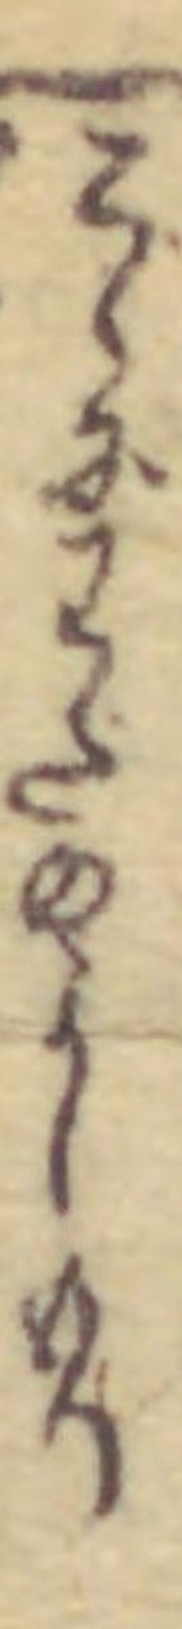こゝにわたのよしもり
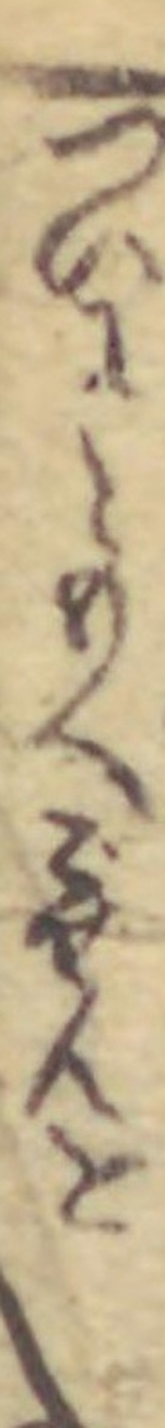ついにともへごせんを
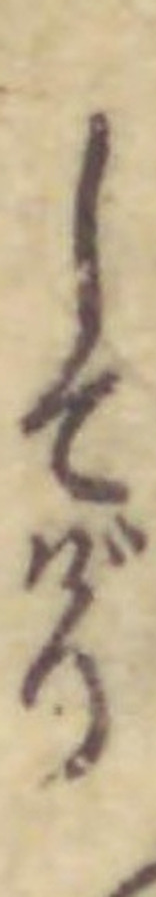してげり
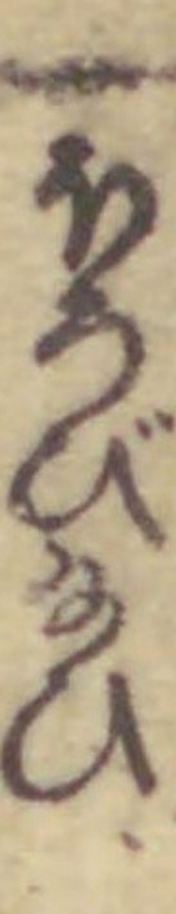ほろび給ひ
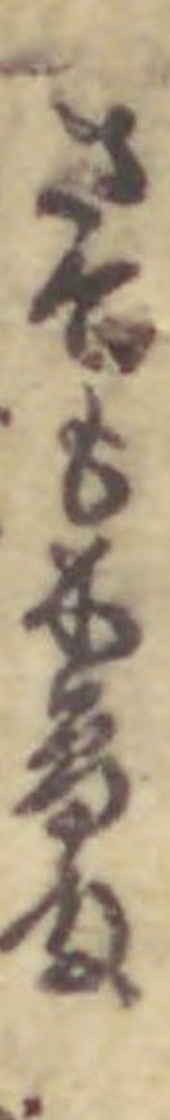さても木曽殿
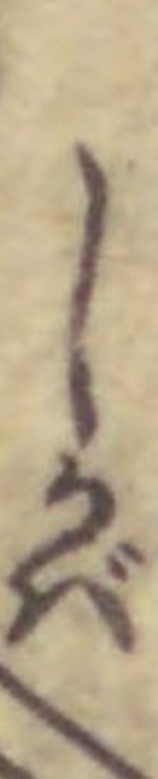しかば
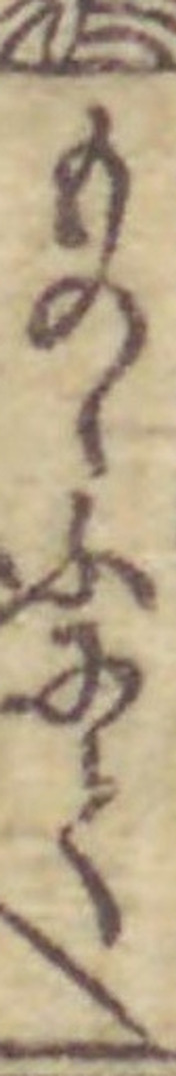ものゝふにて
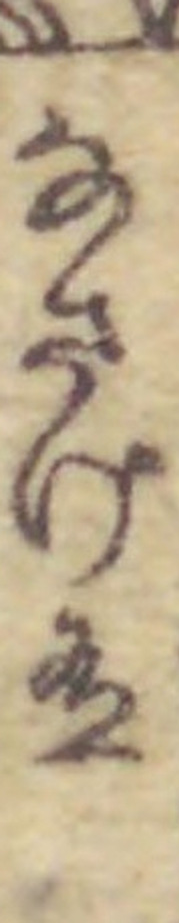なさけ有
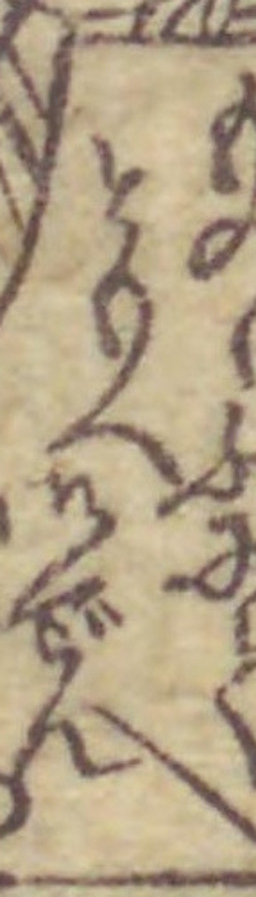ともへ御ぜんの
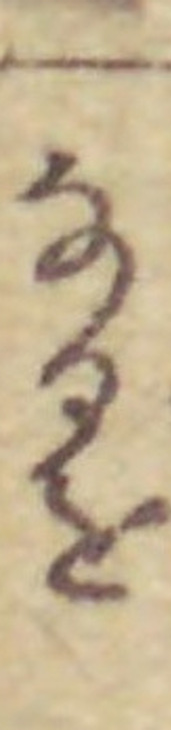なるを
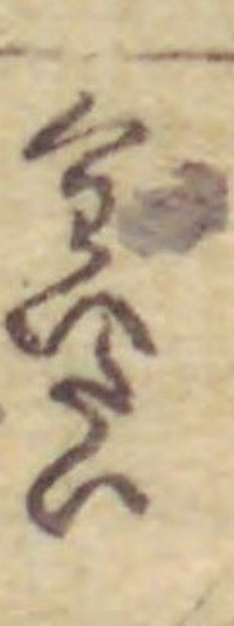くわいたい
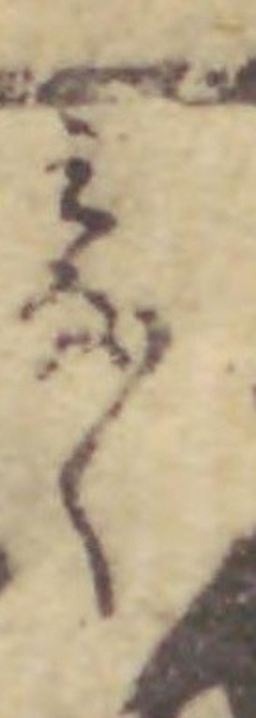みな〳〵
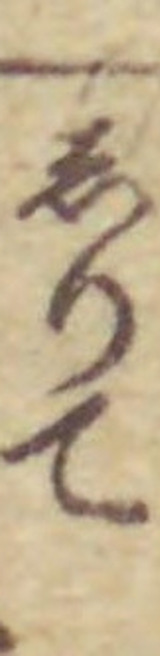しりて
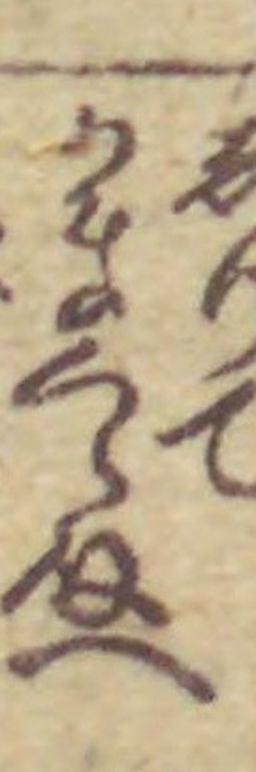かまくらへ
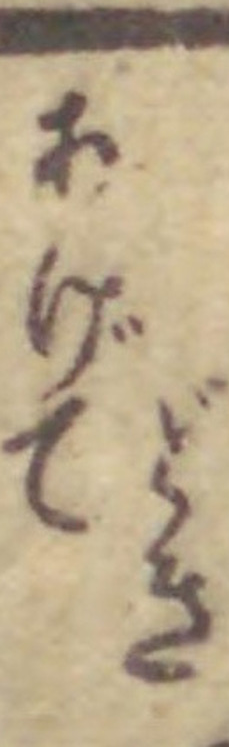あげて
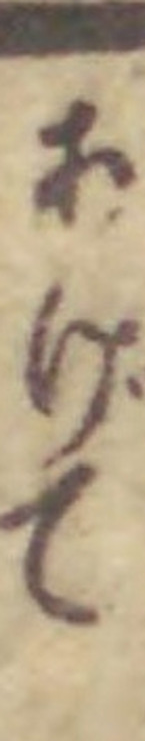あげて
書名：朝比奈草摺実記 2巻
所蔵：国立国会図書館 National Diet Library, JAPAN
